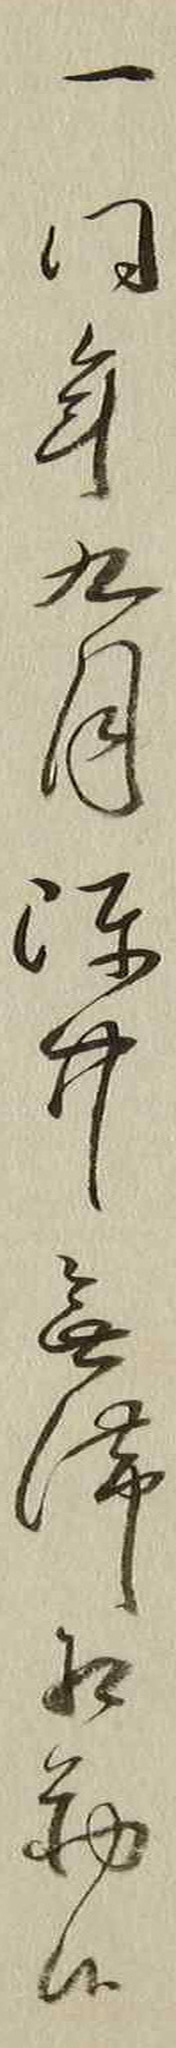一同年九月陣中無滞相勤候
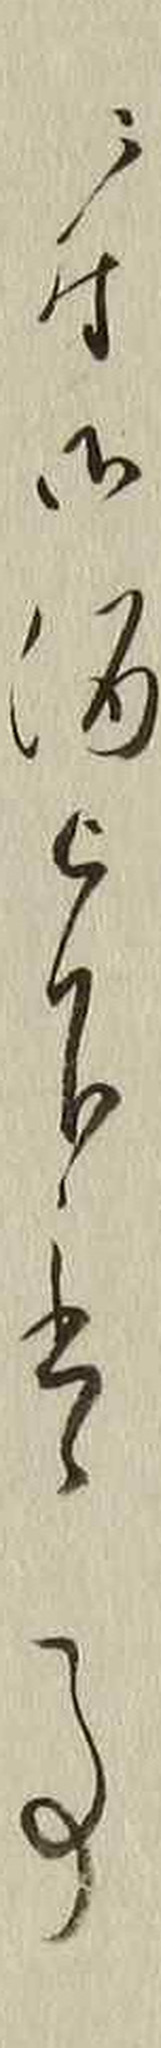ニ付御酒被下置候事
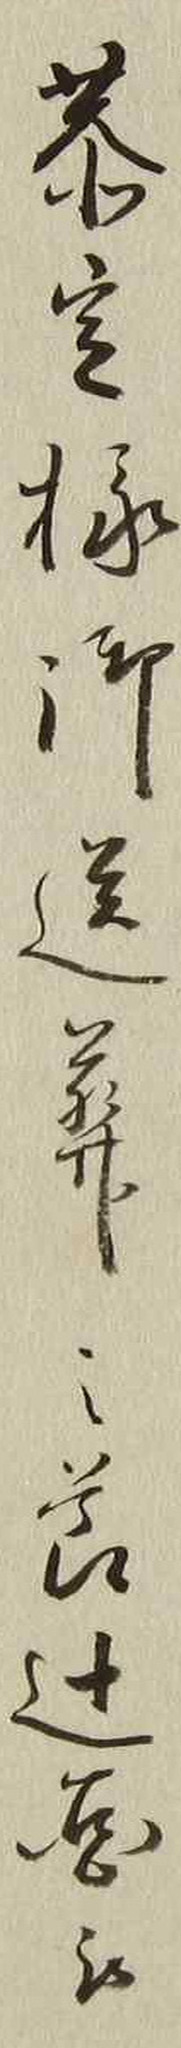恭定様御葬送之節辻固被
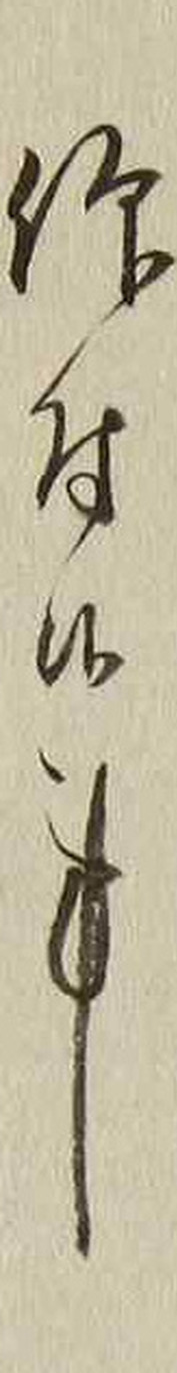仰付候事
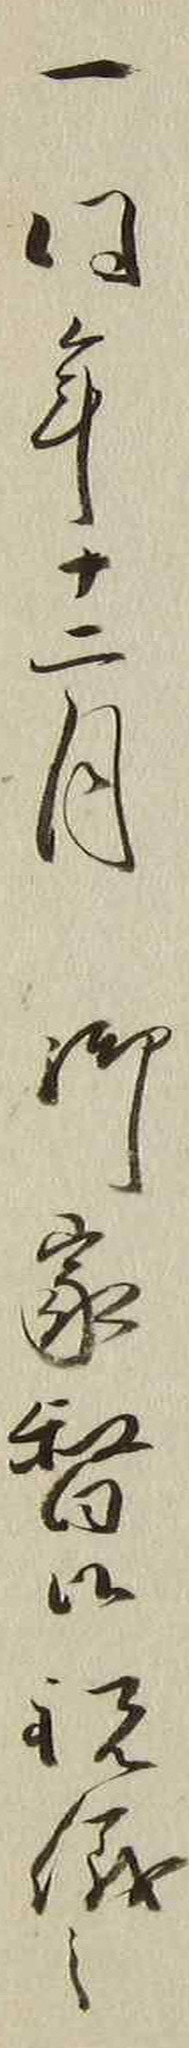一同年十二月御家督御祝儀之
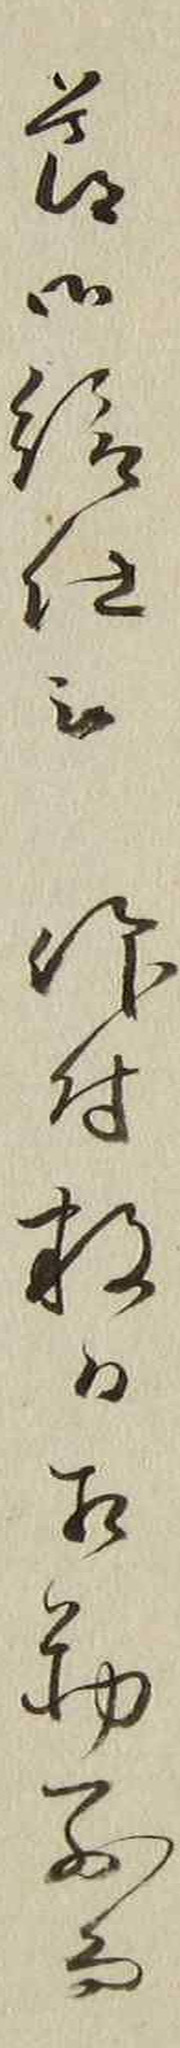節御給仕被仰付数日相勤別而
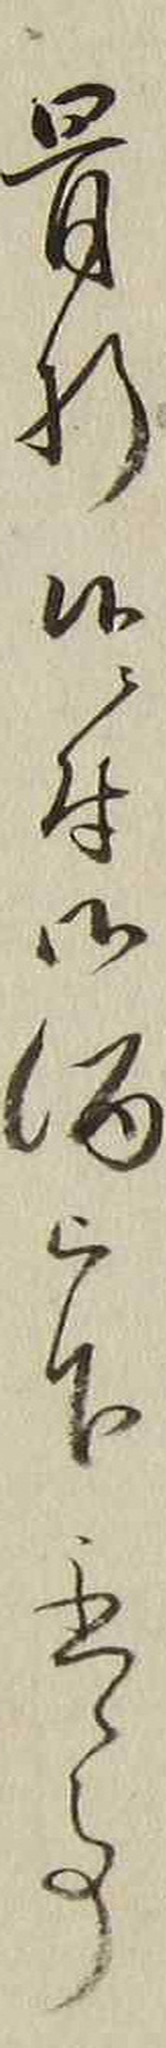骨折候ニ付御酒被下置候事
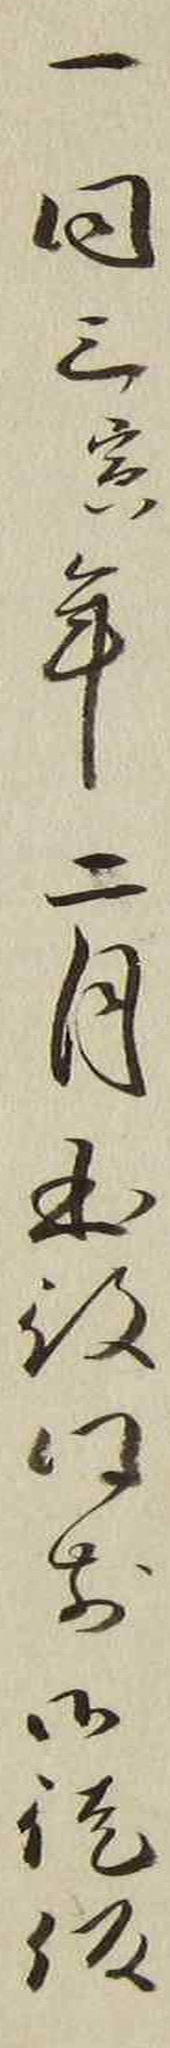一同三寅年二月本役同前御徒仮
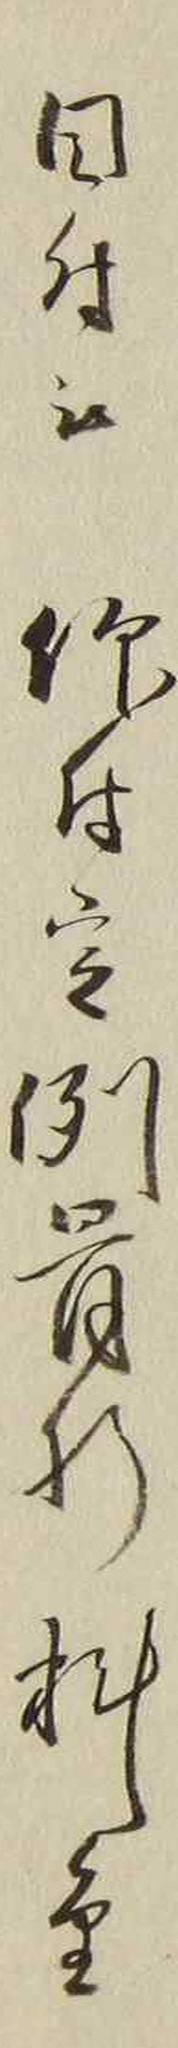目付被仰付定例骨折料金

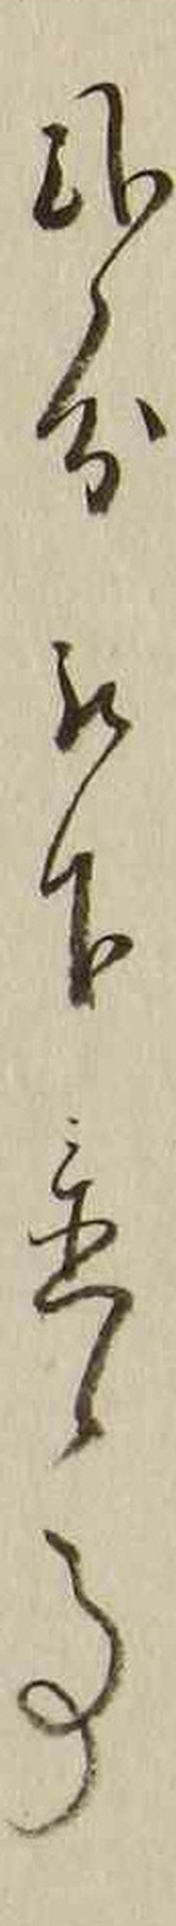弐分被下置候事
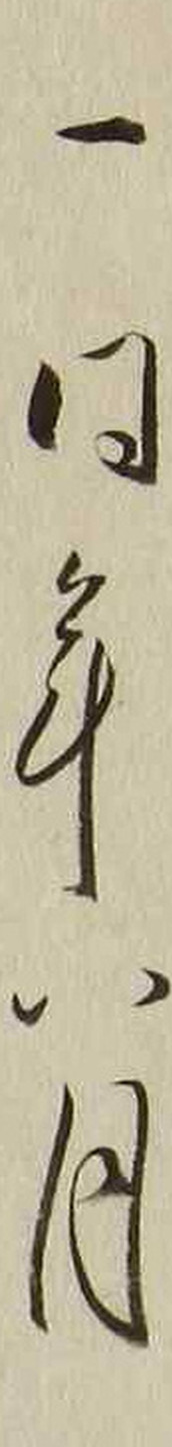一同年八月
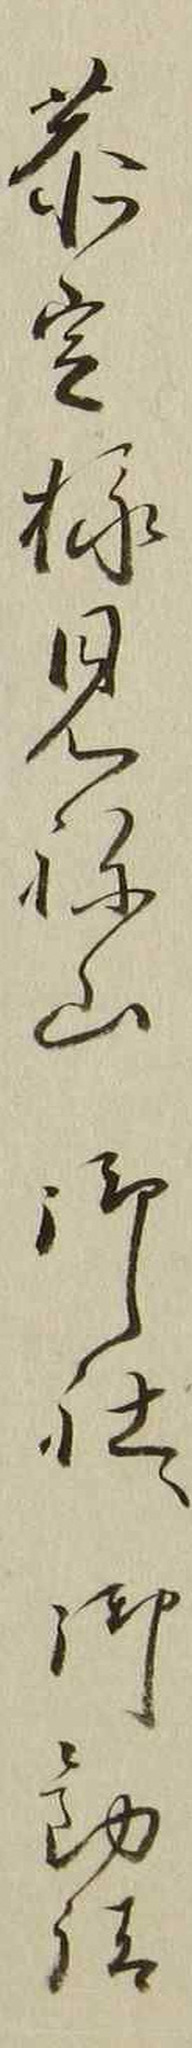恭定様見祢山御仕へ御勧請
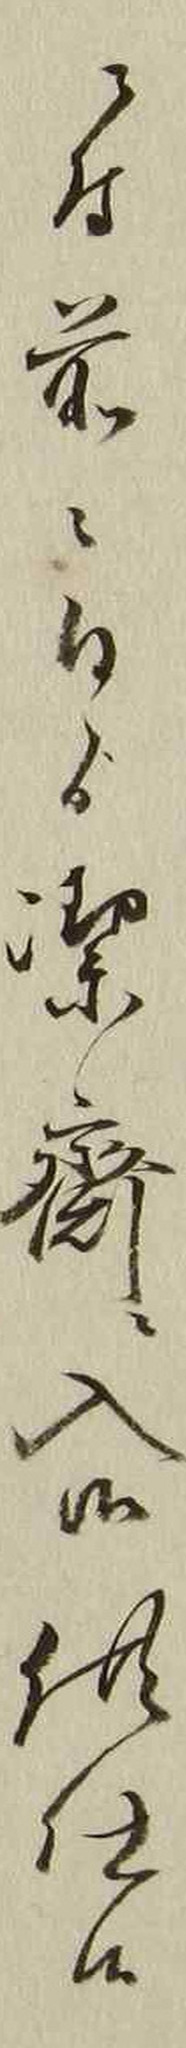ニ付前々日ゟ潔斎ニ入御供仕候
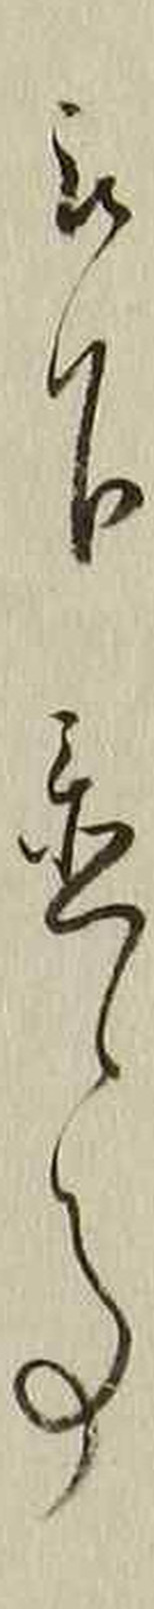被下置候事
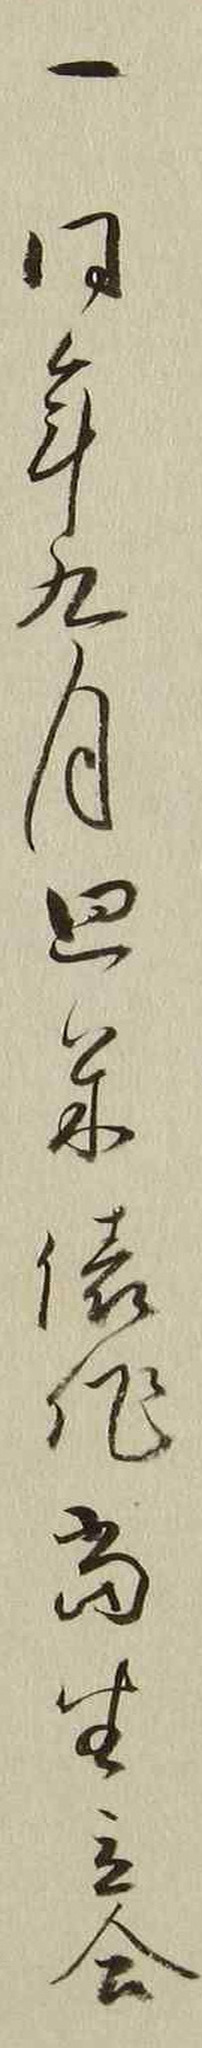一同年九月廻米俵作当生立合
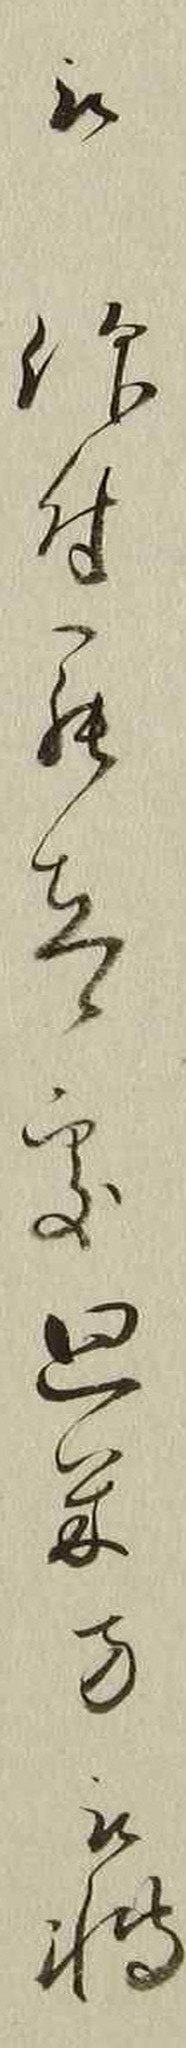被仰付罷在候処廻米方被転
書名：諸士系譜　巻之52　に之部3
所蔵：会津若松市立会津図書館
